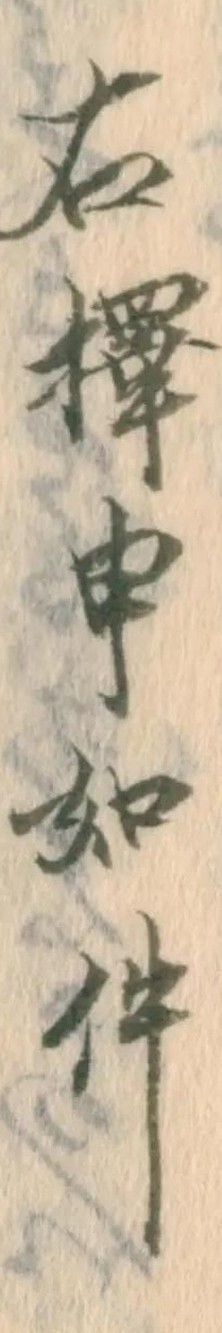右択申如件
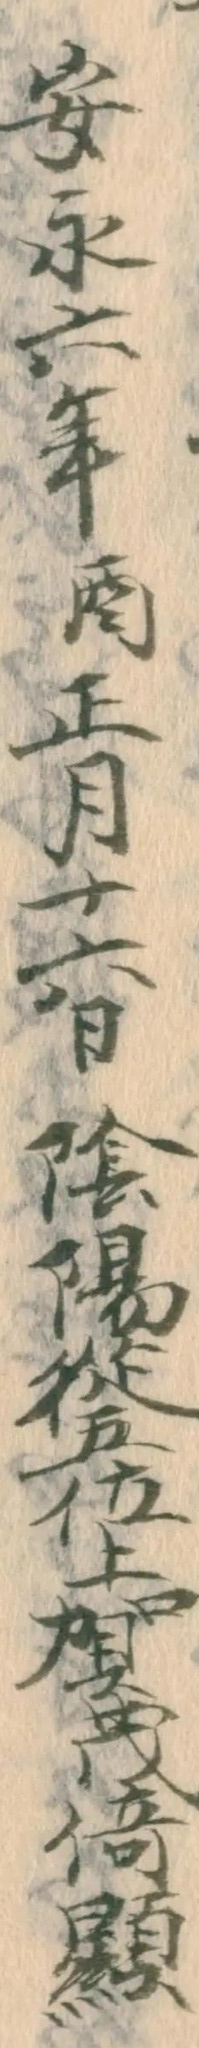安永六年酉正月十六日陰陽従五位上賀茂倚顕
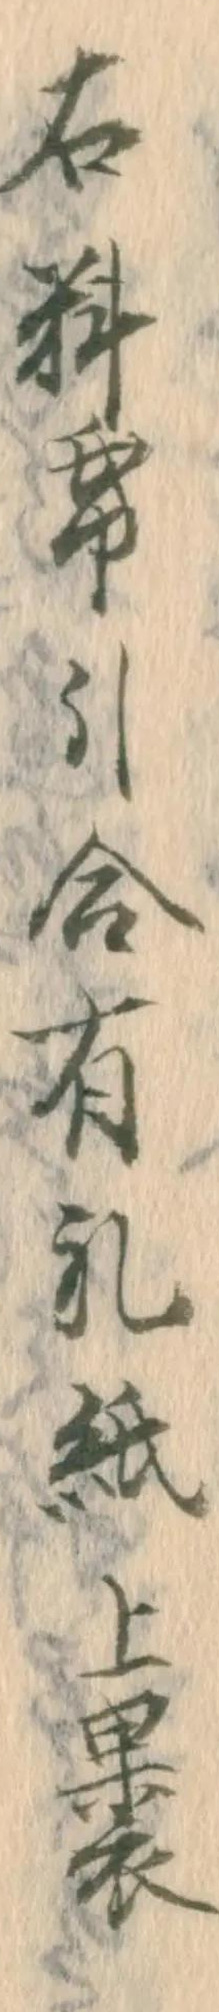右料帋引合有礼紙上褁
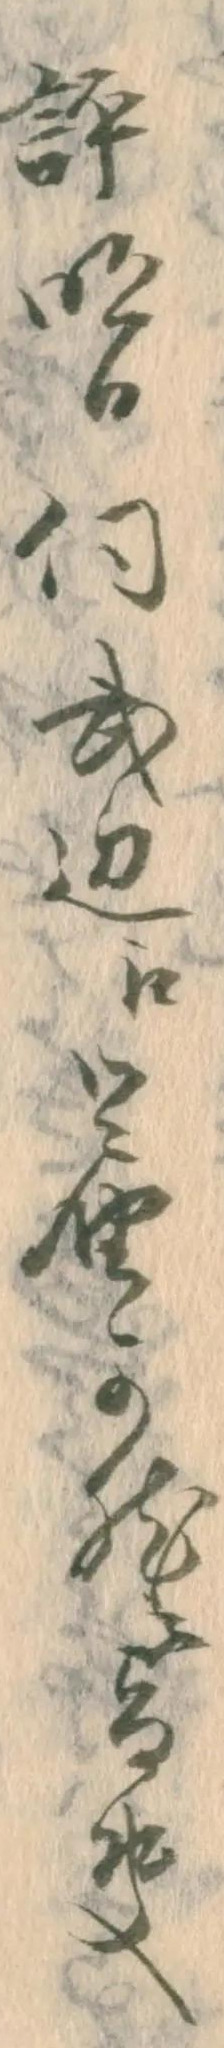評明日伺武辺江御届可然旨決
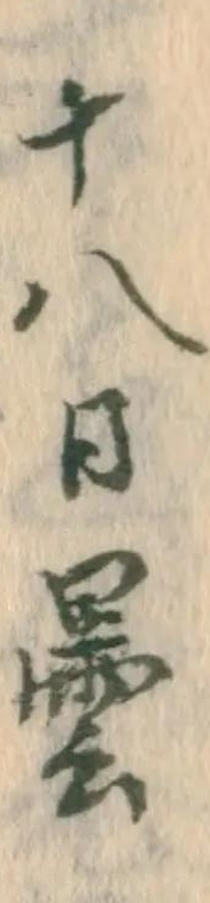十八日曇
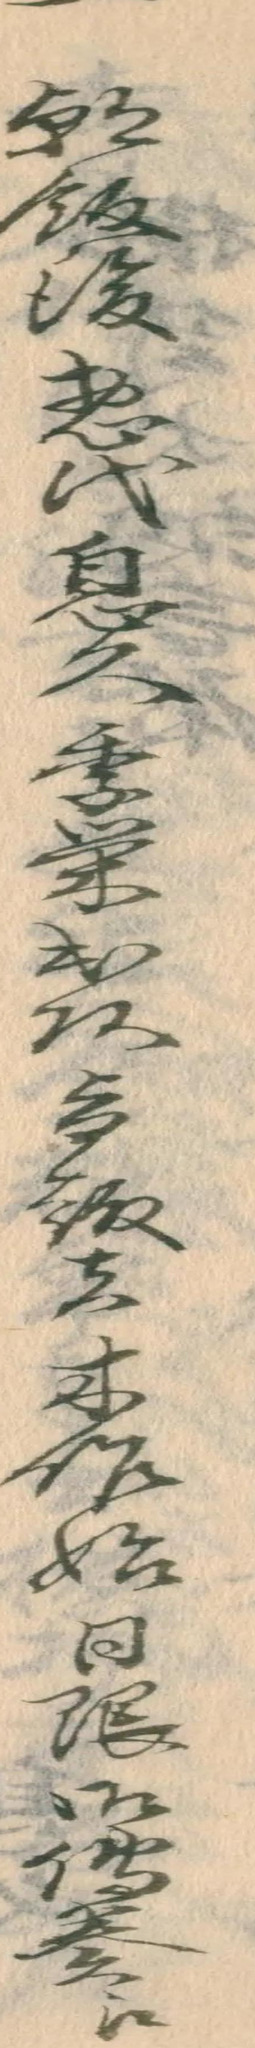一朝飯後惣代息久季栄出頭旨趣は木作始日限御伝奏江
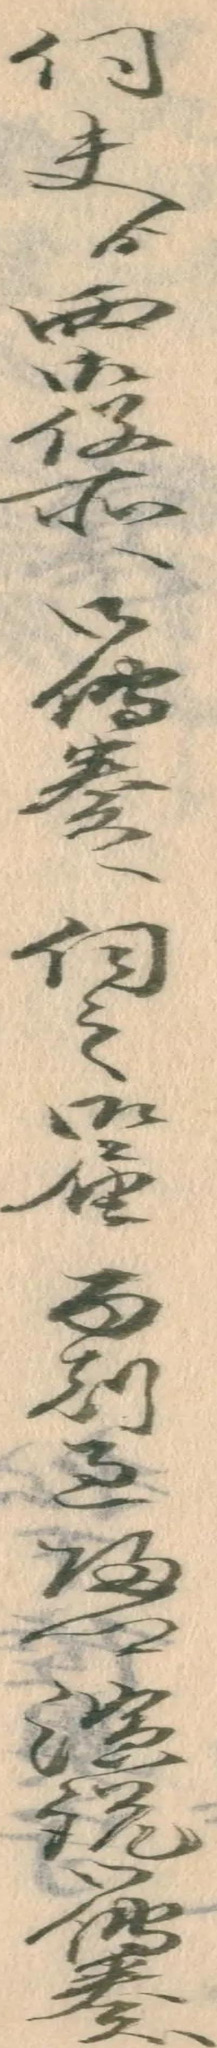伺夫ゟ西御役所へ御伝奏へ伺之御届酉刻過帰郷演説御伝奏へ
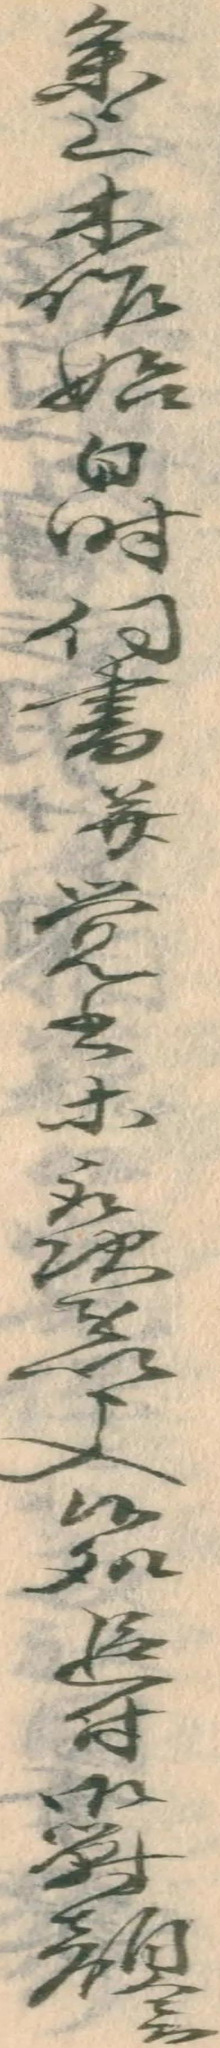参上木作始日時伺書并覚書等取次を以申入候処追付御対顔ニ而
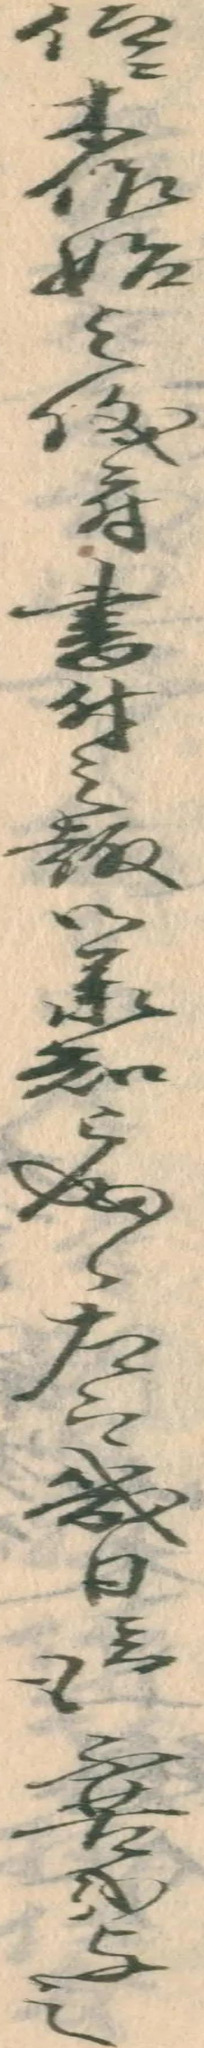仰ニ木作始之儀ニ付書付之趣御承知被成候左候ハヽ幾日ニ而も不苦哉与之
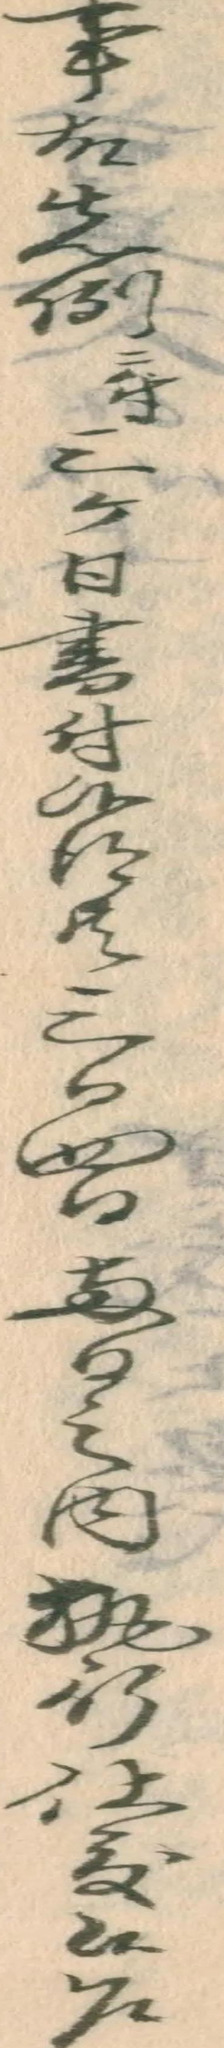事故先例ニ付三ヶ日書付候得共三日四日両日之内執行仕度候乍
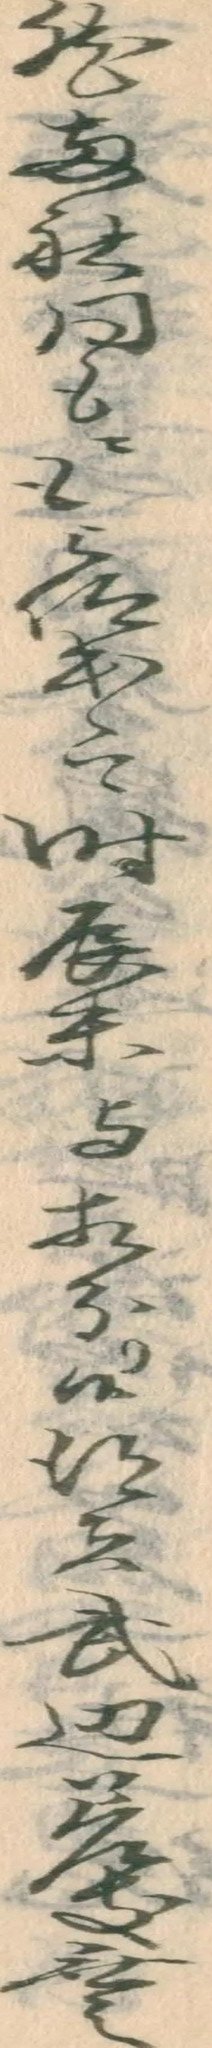然両社同もニも被仰出候ハヽ時辰未与相分り候得は武辺差支無之
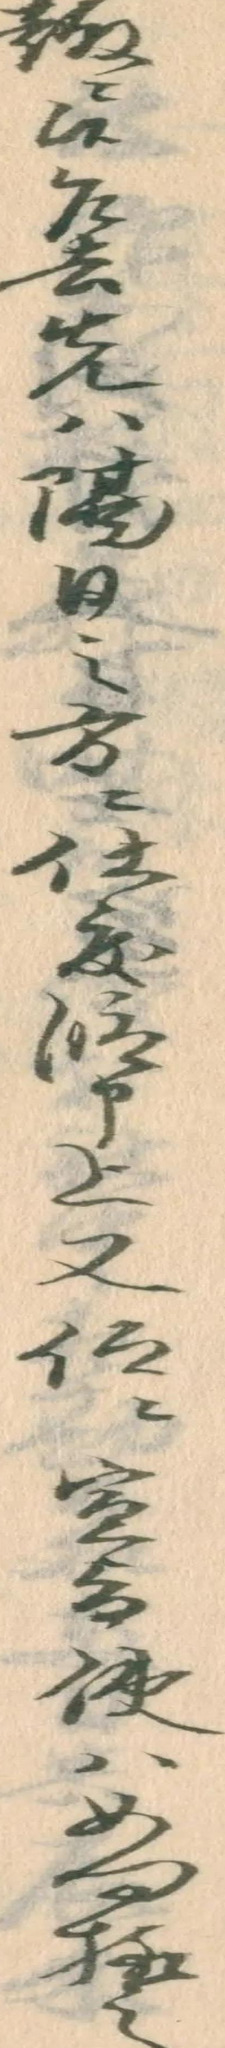趣ニ候乍去先ハ隔日之方ニ仕度段申上又仰ニ宣旨使ハ如何様之
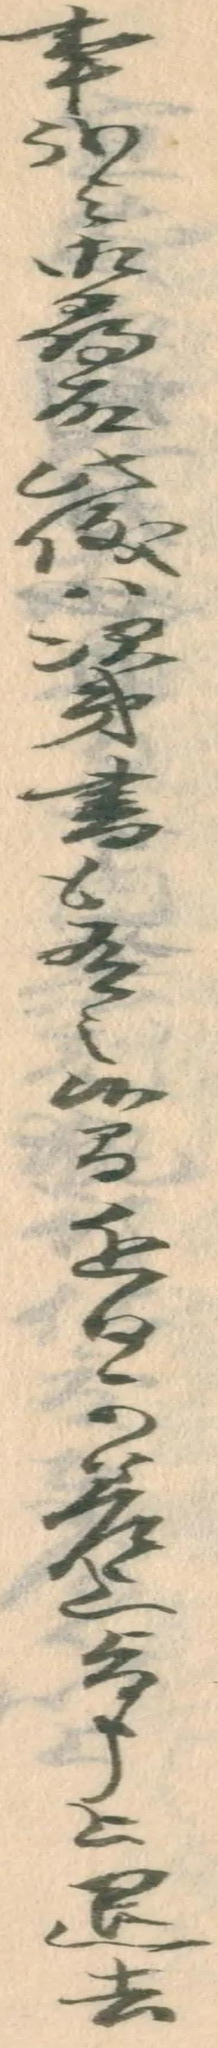事哉与御尋故此儀ハ次第書も有之候間近日可差上旨申上退去
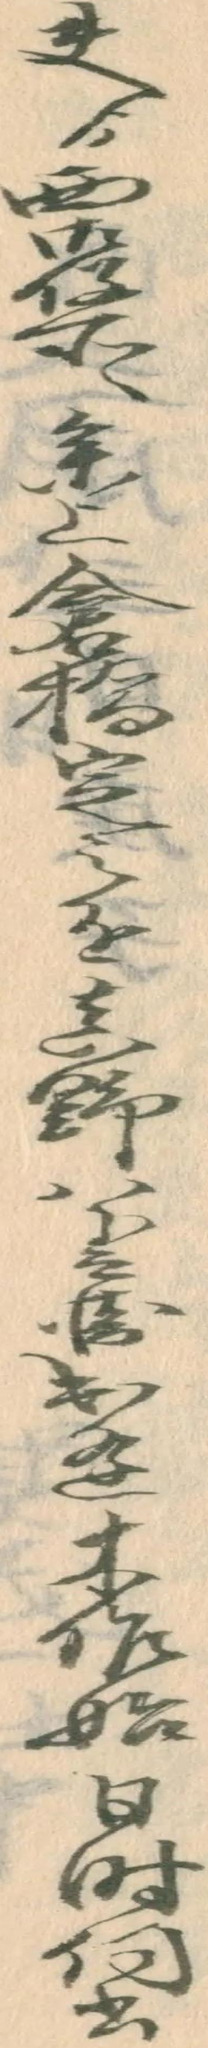夫ゟ西御役所へ参上倉橋定之進真野八郎兵衛出逢木作始日時伺書
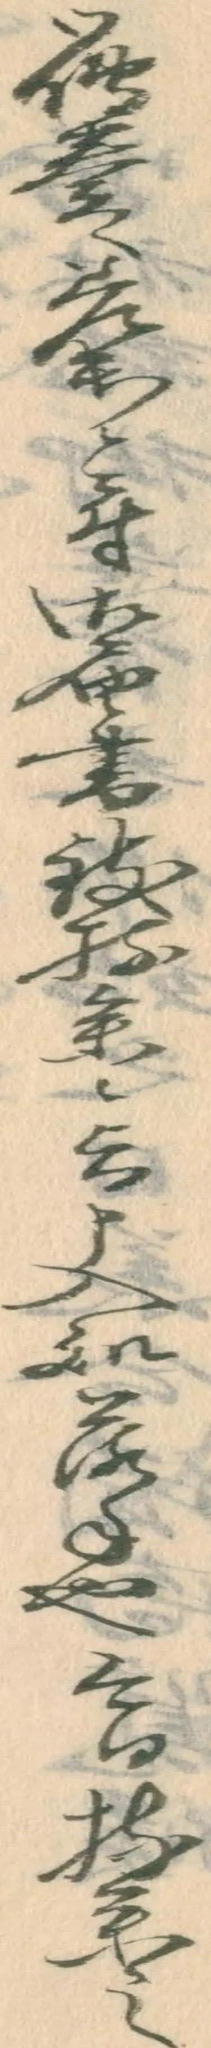御伝奏へ差出候ニ付御届書致持参候旨申入処落手也今日持参之
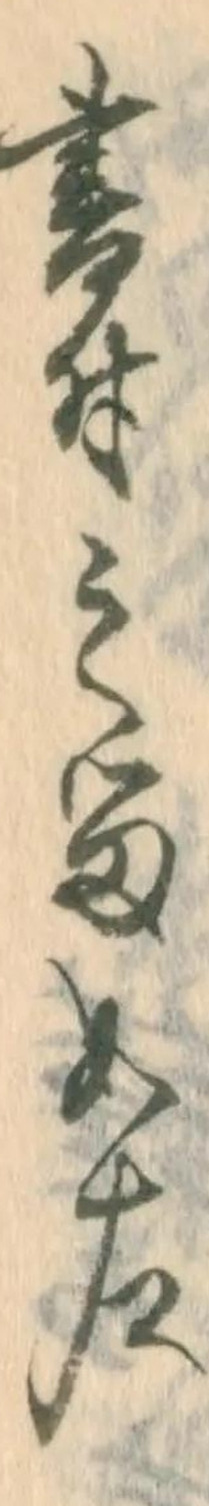書付之留如左
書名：賀茂社記録. 第17冊
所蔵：国立国会図書館 National Diet Library, JAPAN
